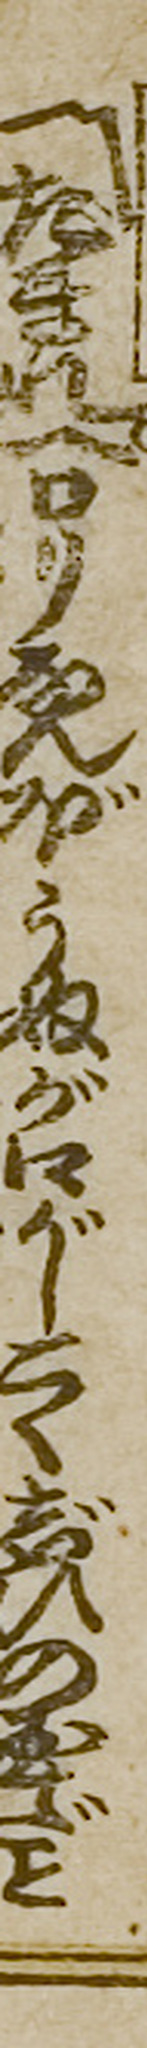だまれペロリなんぼうぬらが口がしこくじひの国だと
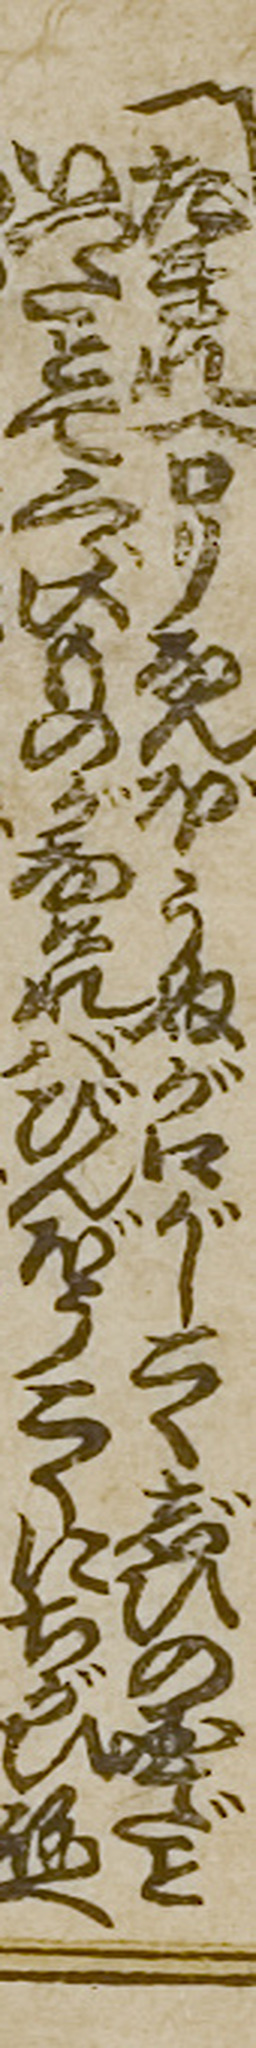いつたとてくらいものがなければびんぼうこくにちがいねへ
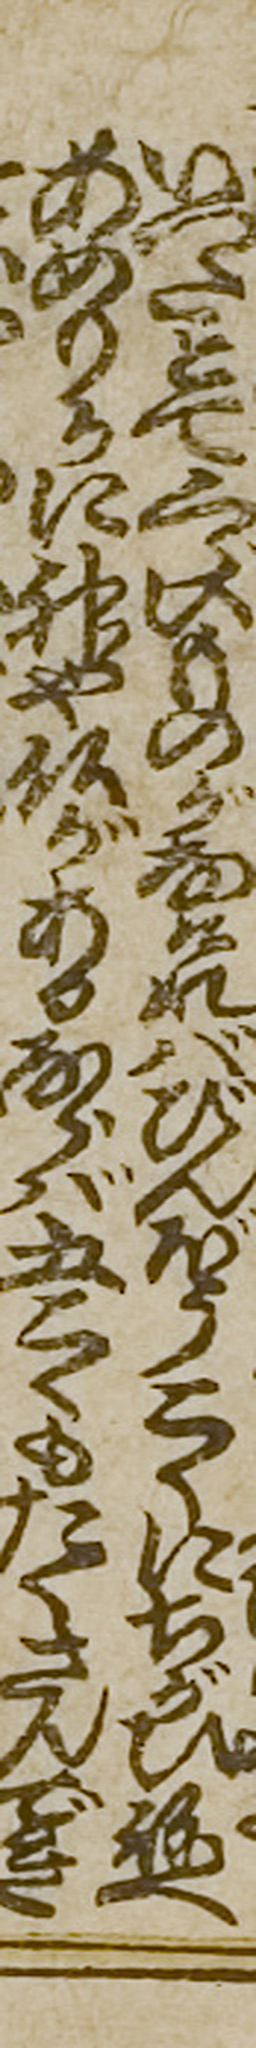あめりかに神や仏があるならば五こくもたくさんでき
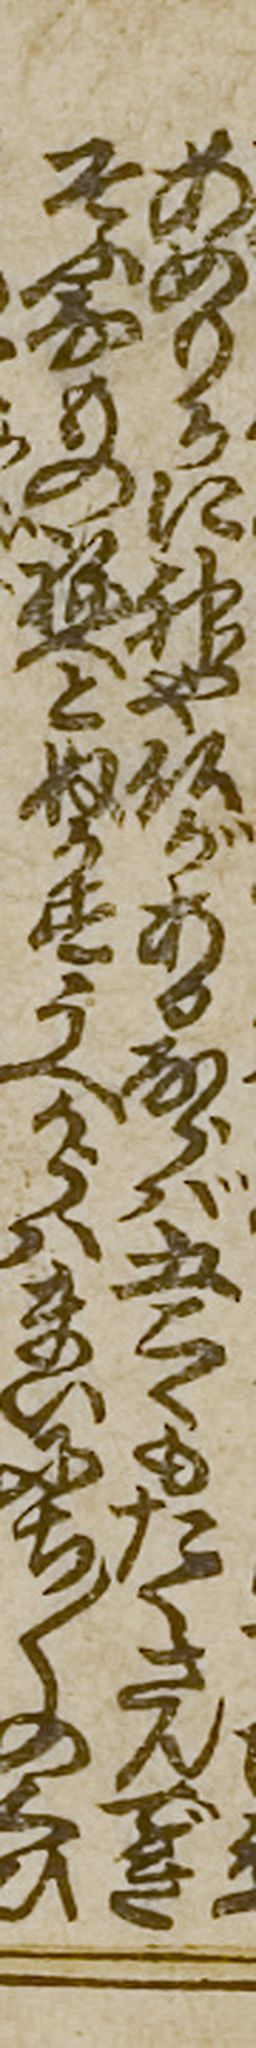そふなものねへとぬかすうへからはまいにちまいにちのくひ
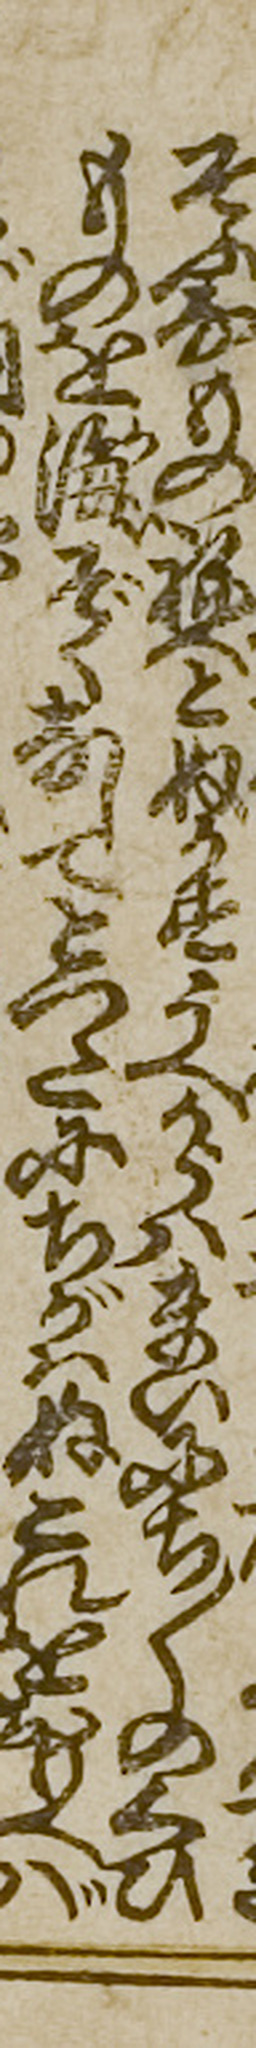ものを海ぞくなしてとつたにちがはぬこれをおもへば
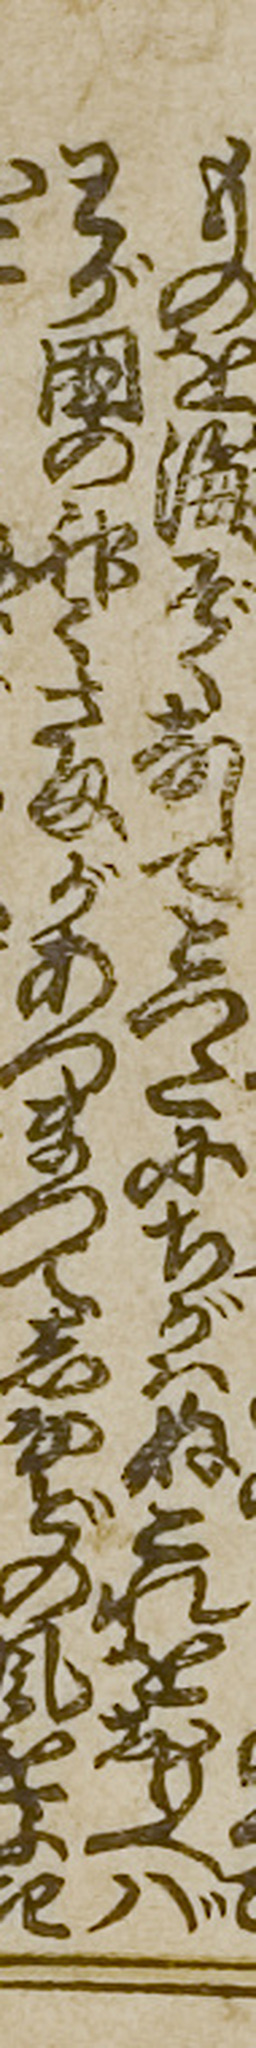わが国の神々さまがあつまつてしなどの風をふき
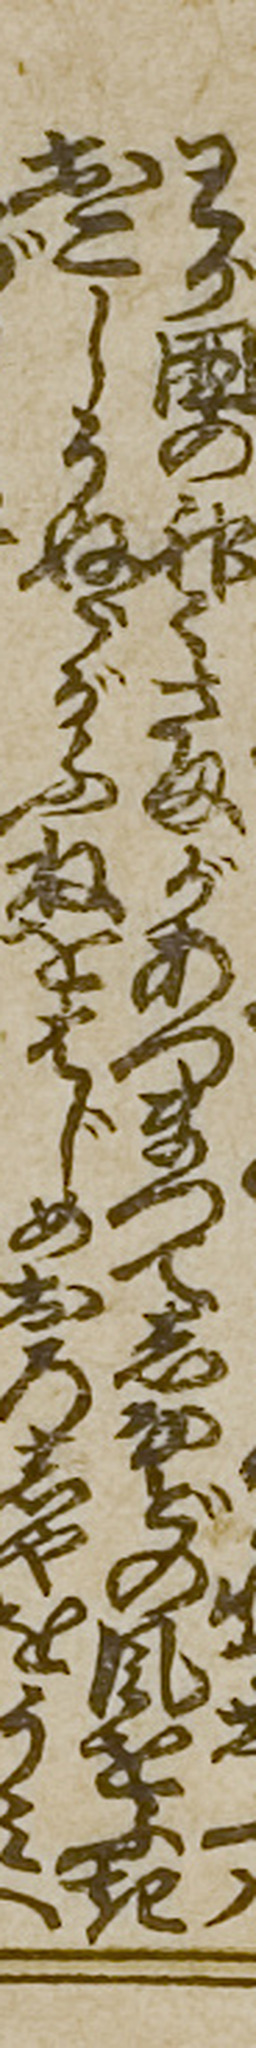おこしうぬらがふねをはじめおろしやをうみへ
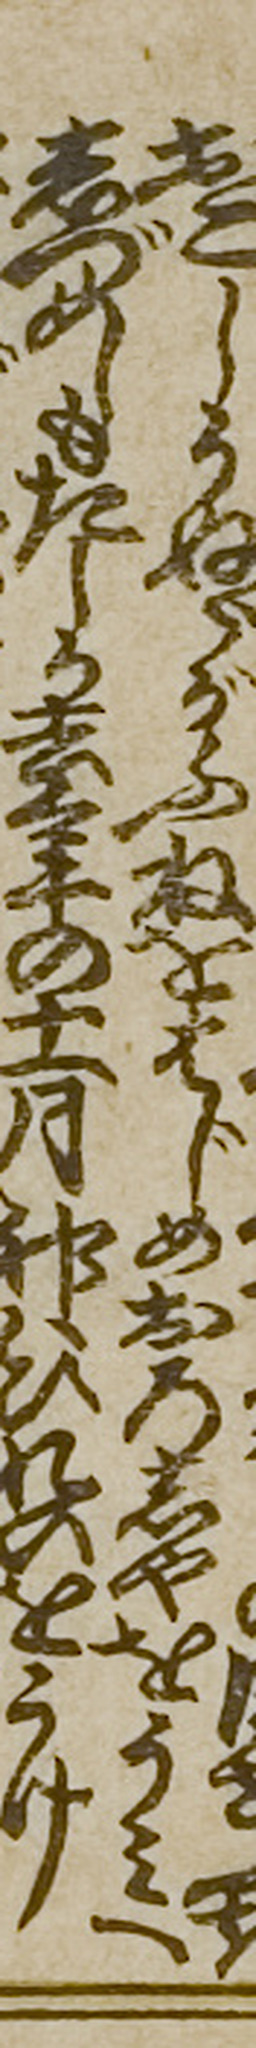しづめしもたしか去年の十一月神はひれいをうけ
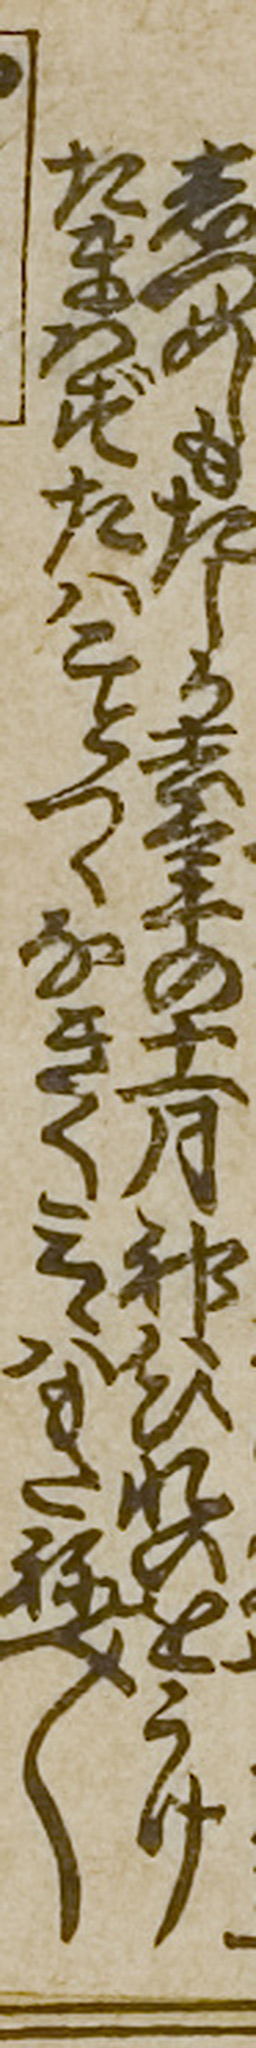たまはずたはことつくなきくみゝはもたねへもたねへ
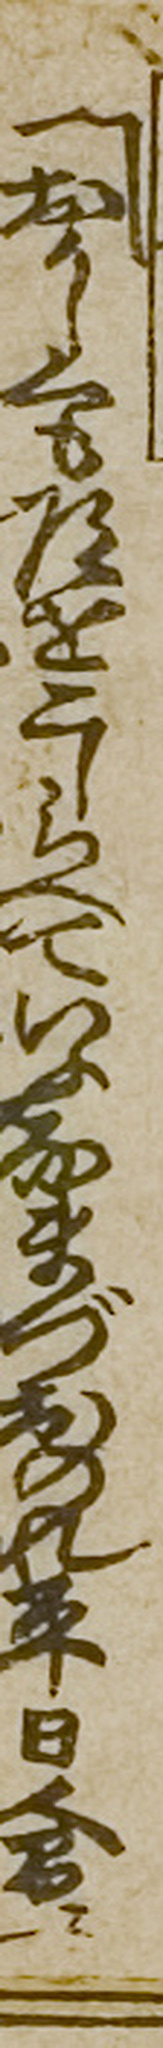おかしくも道をこしらへていふなまづおのれ平日人間に
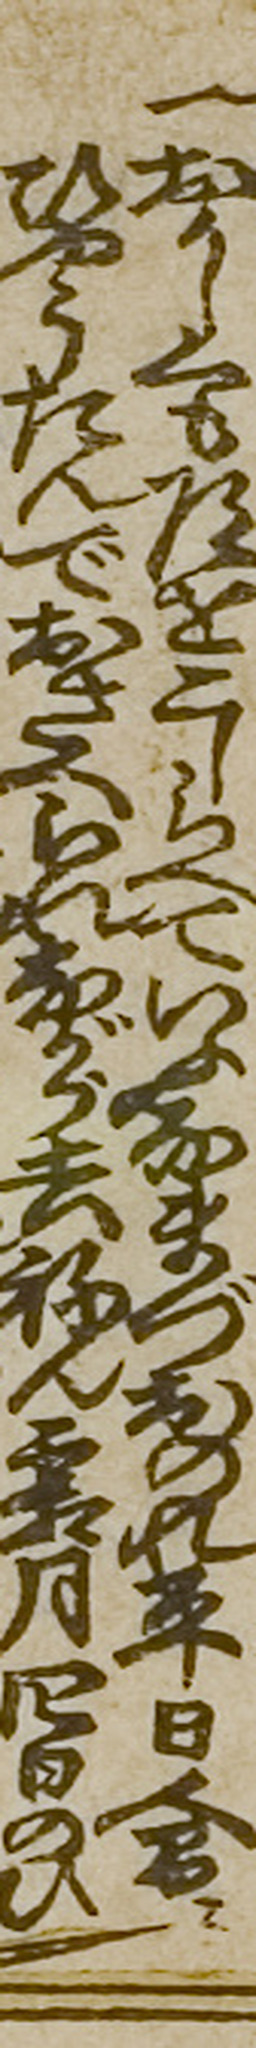ひやうたんでおさへられながら去ねん霜月四日のひ
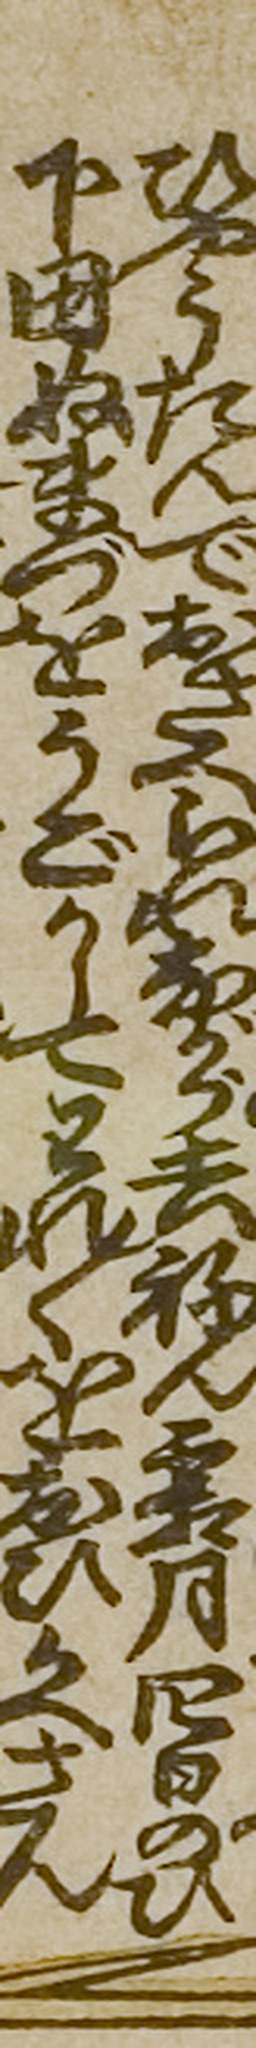下田ぬまづをうごかしてわれわれをおひかへさん
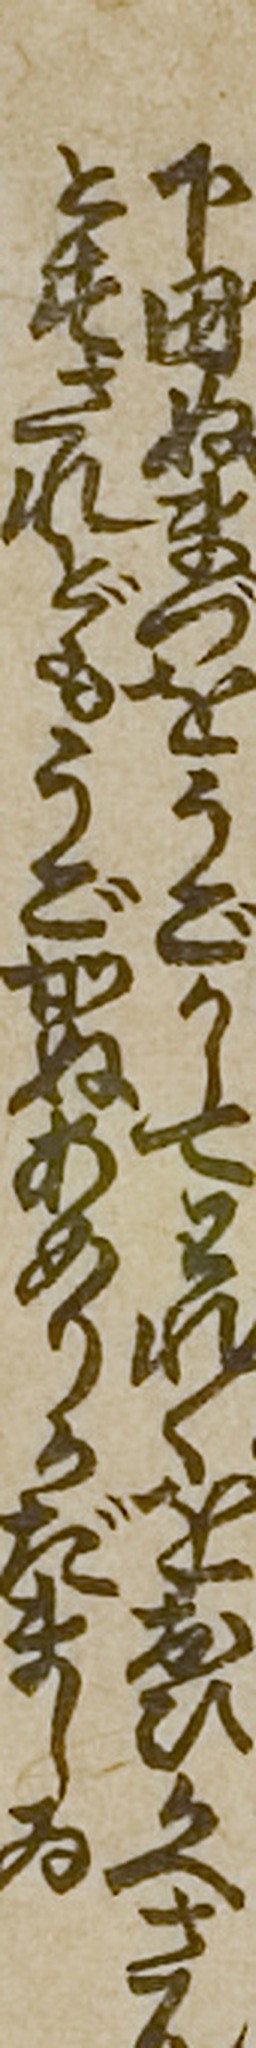とすされどうごかぬあめりかだましゐ
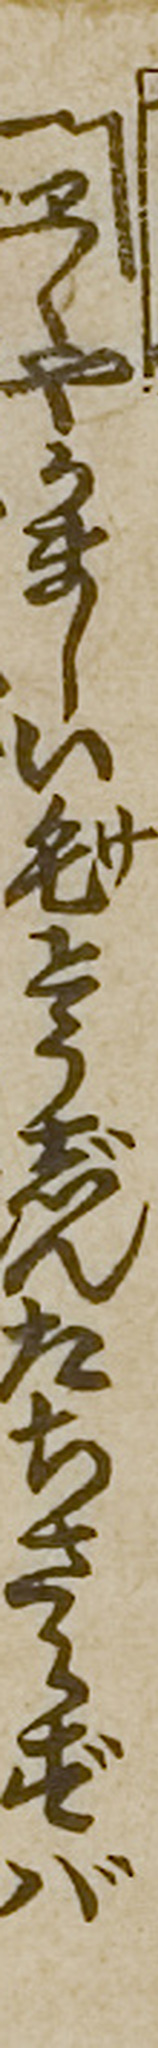ヱゝやかましい毛とうじんたちさらずば
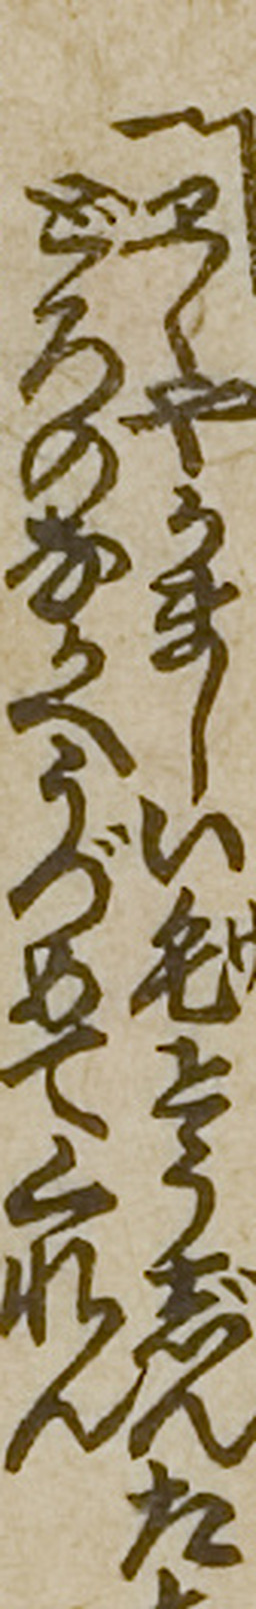どろのなかへうづめてくれん
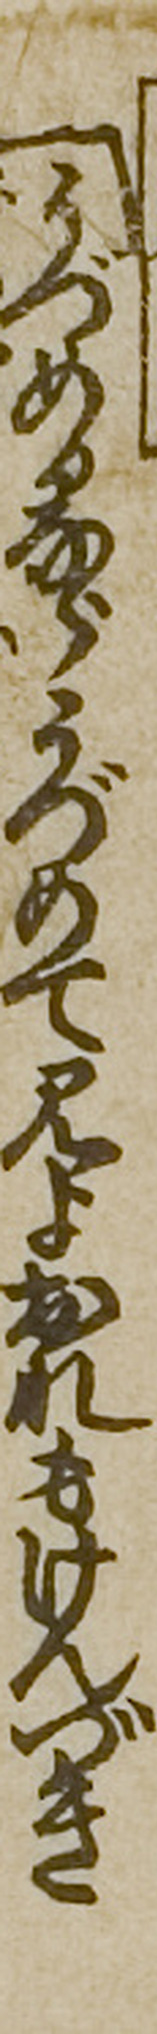うづめるならうづめてみよおれもけんづき
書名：安政二年十月二日夜大地震鯰問答
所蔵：東京大学総合図書館 General Library in the University of Tokyo, JAPAN
